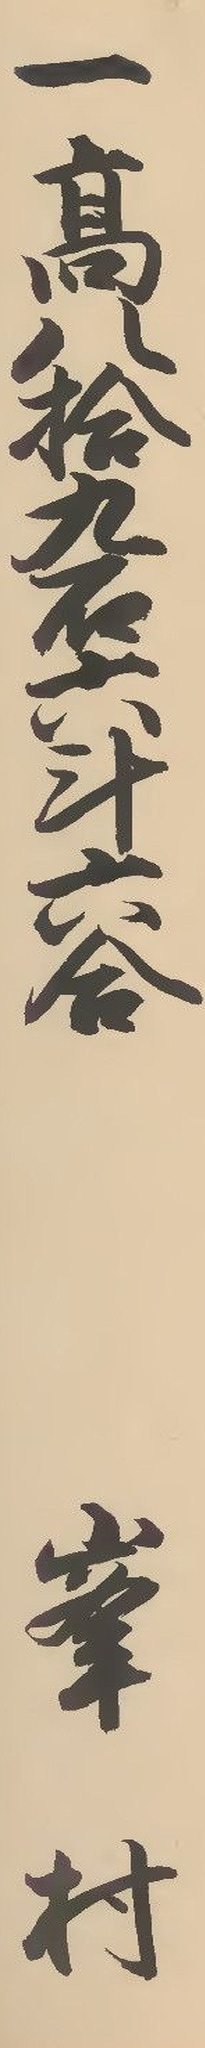一高八拾九石六斗六合峯村
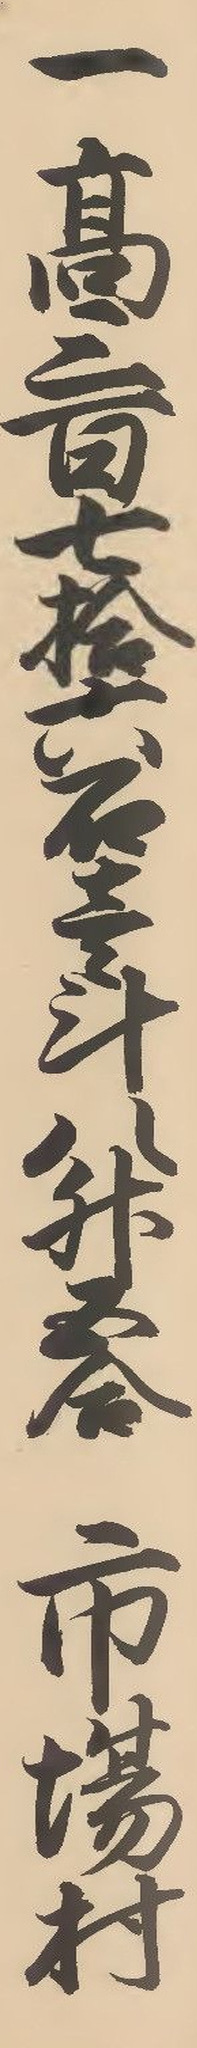一高三百七拾六石壱斗八升五合市場村
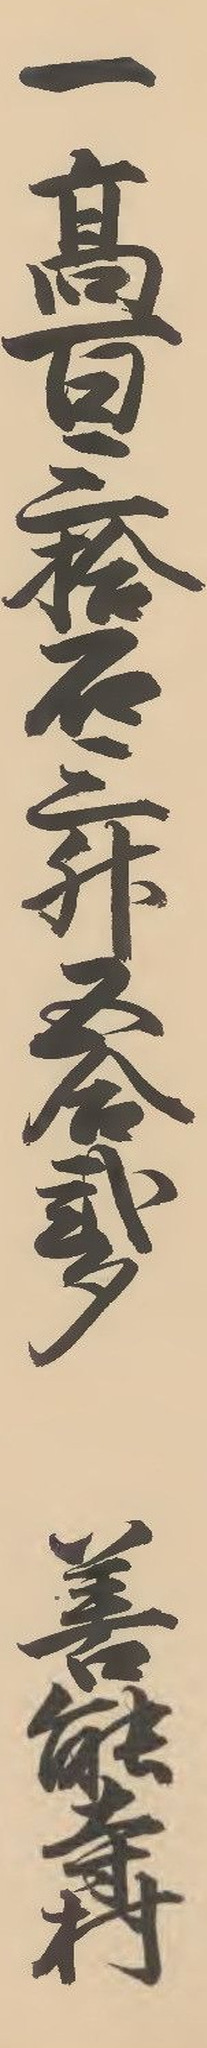一高百三拾石三升五合弐勺善能寺村
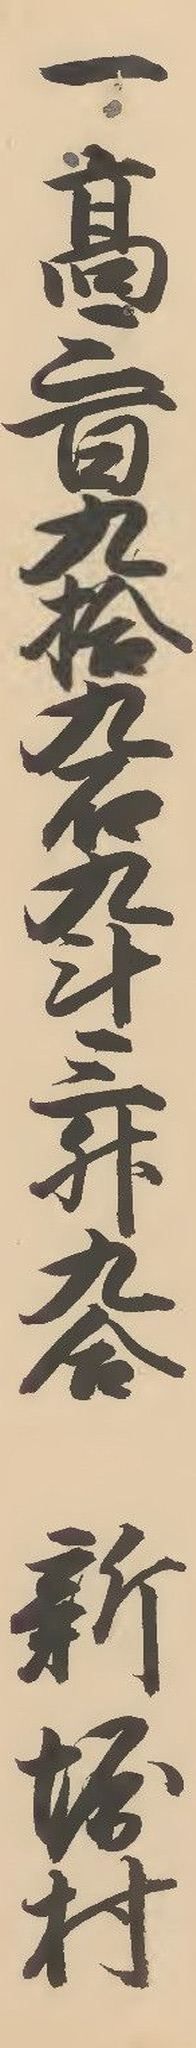一高三百九拾九石九斗三升九合新堀村

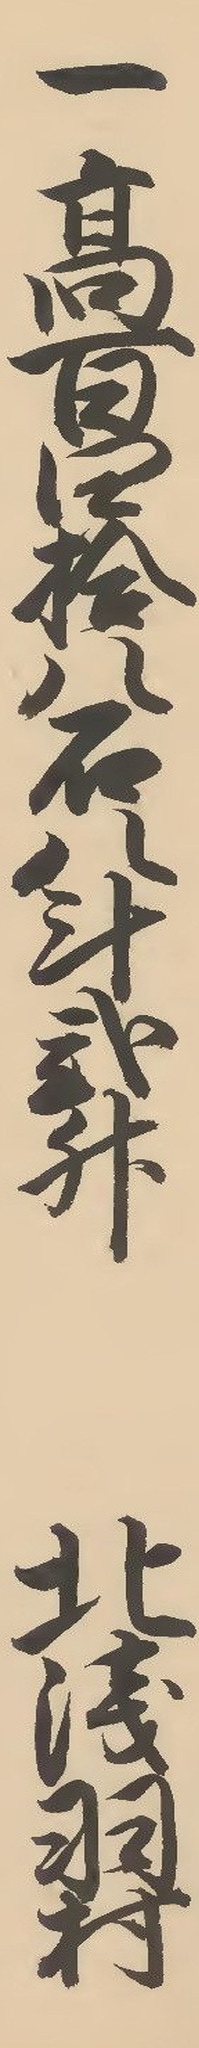一高百四拾八石八斗弐升北浅羽村
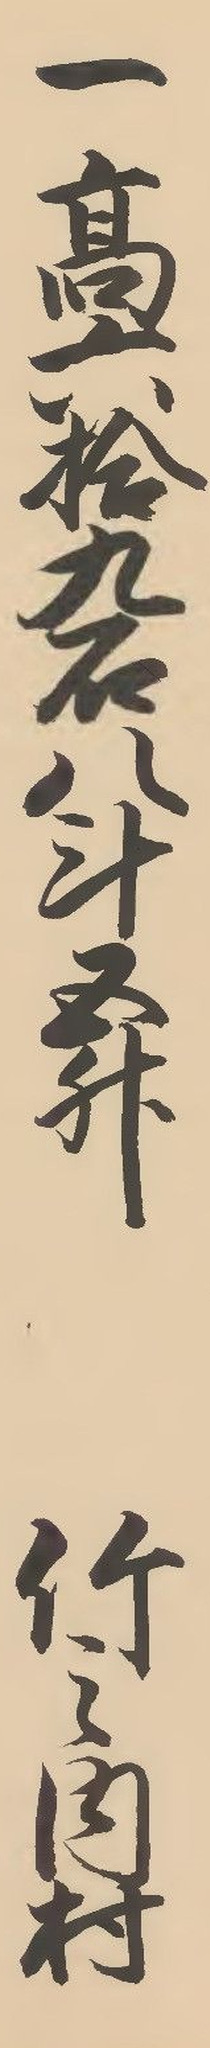一高六拾九石八斗五升竹之内村
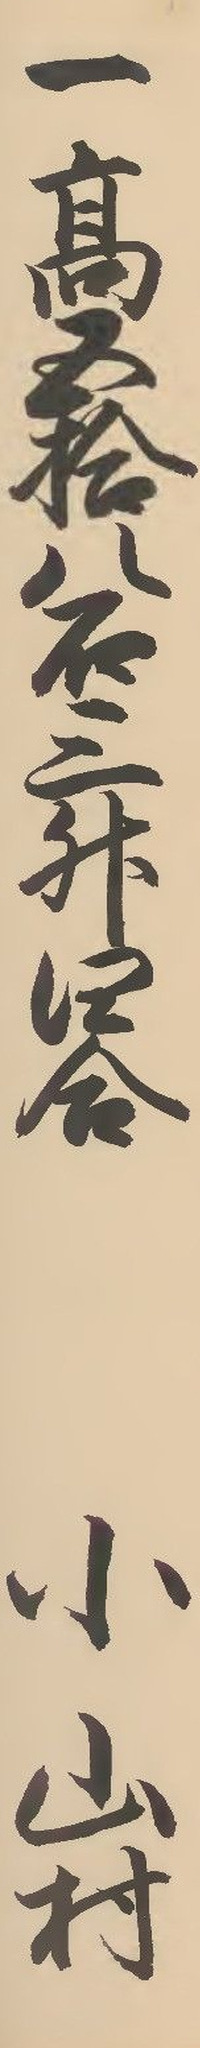一高五拾八石三升四合小山村
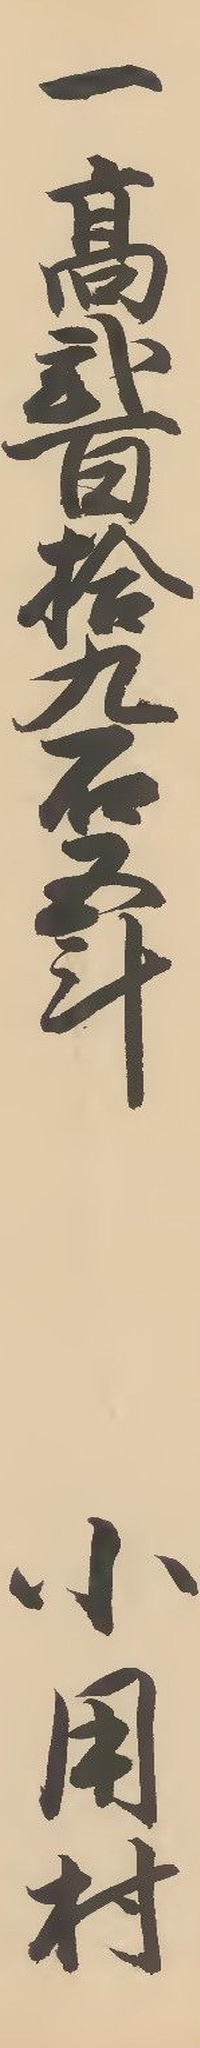一高弐百拾九石五斗小用村
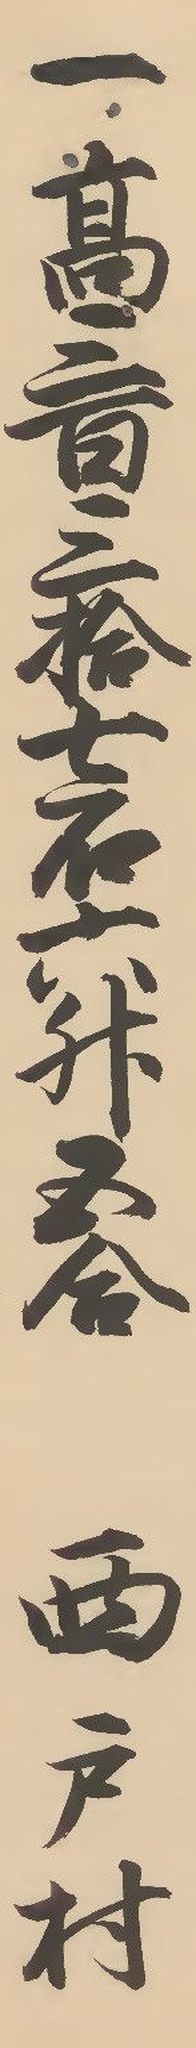一高三百三拾七石六升五合西戸村

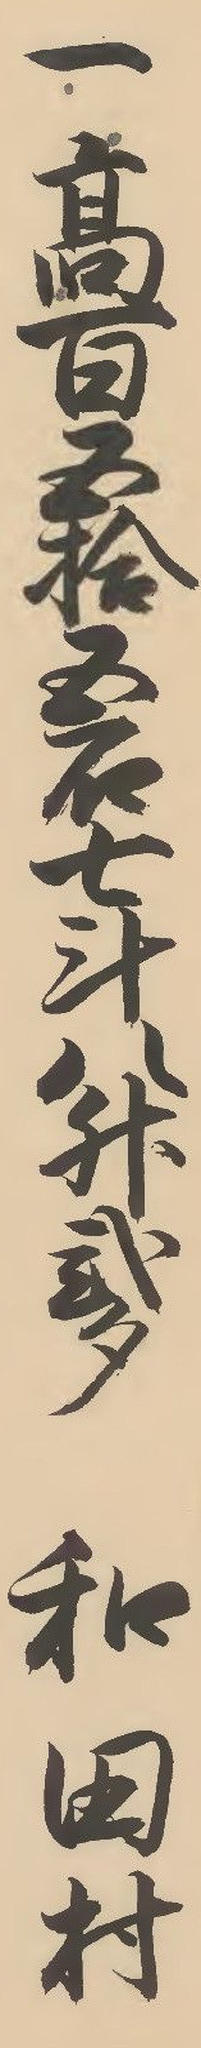一高百五拾五石七斗八升弐勺和田村
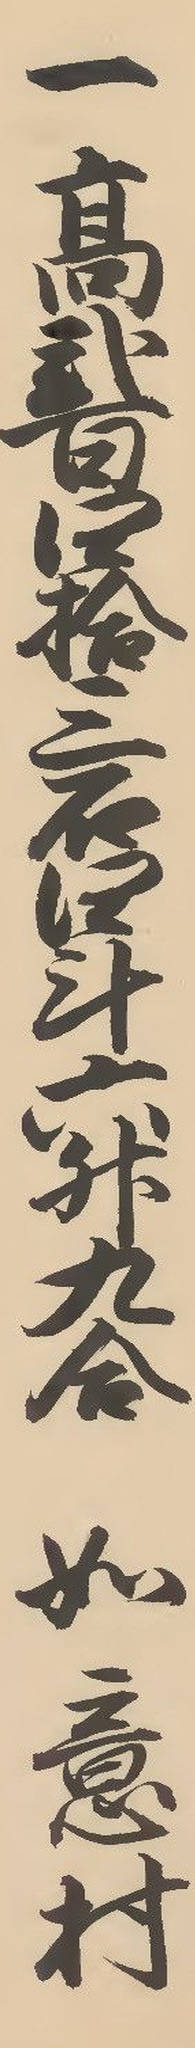一高弐百四拾三石四斗六升九合如意村
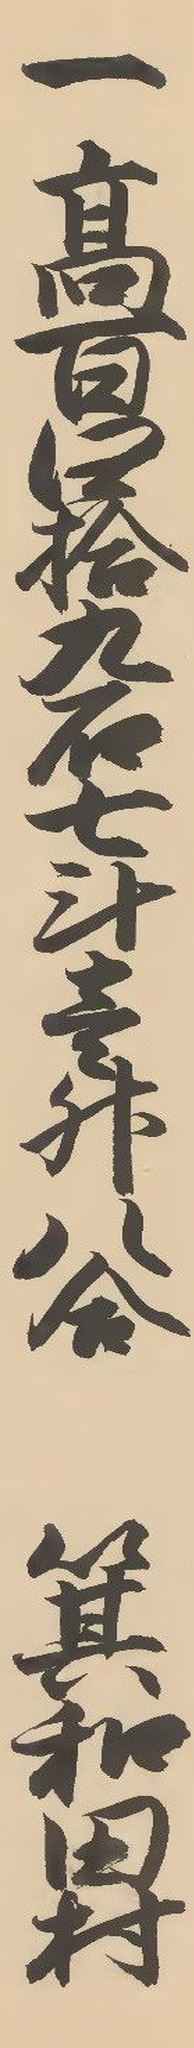一高百四拾九石七斗壱升八合箕和田村
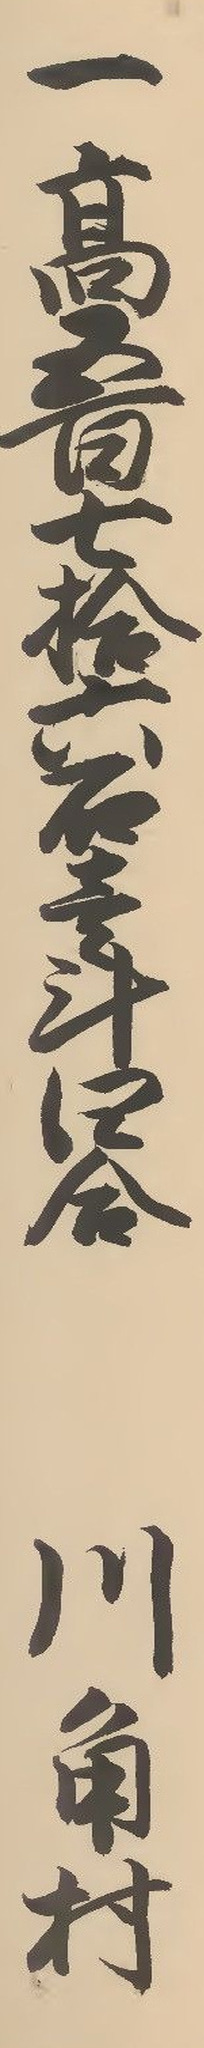一高五百七拾六石壱斗四合川角村
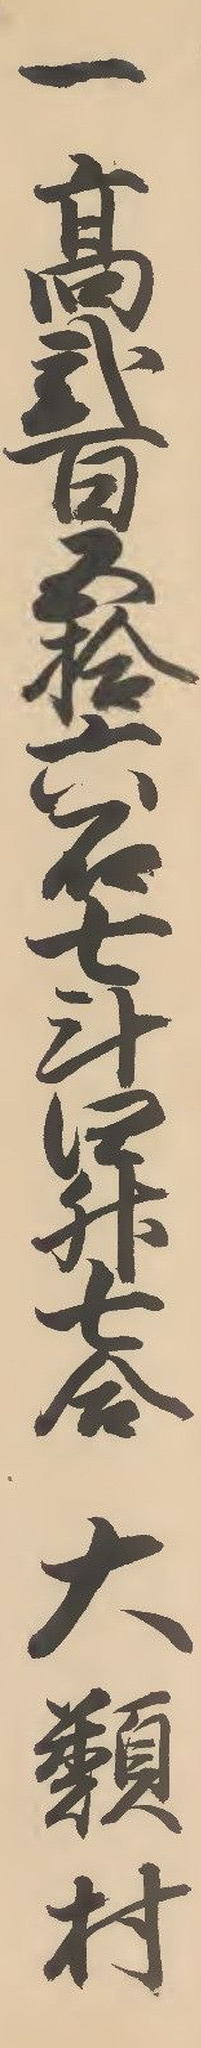一高弐百五拾六石七斗四升七合大類村
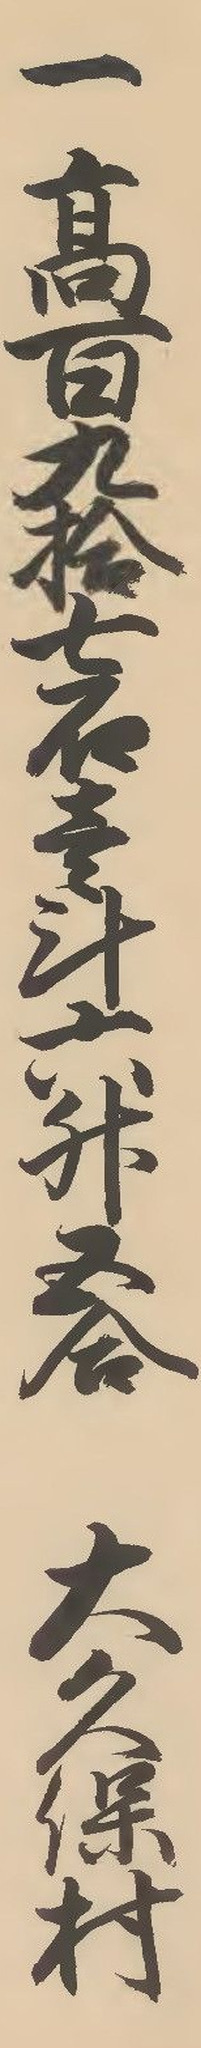一高百九拾七石壱斗六升五合大久保村
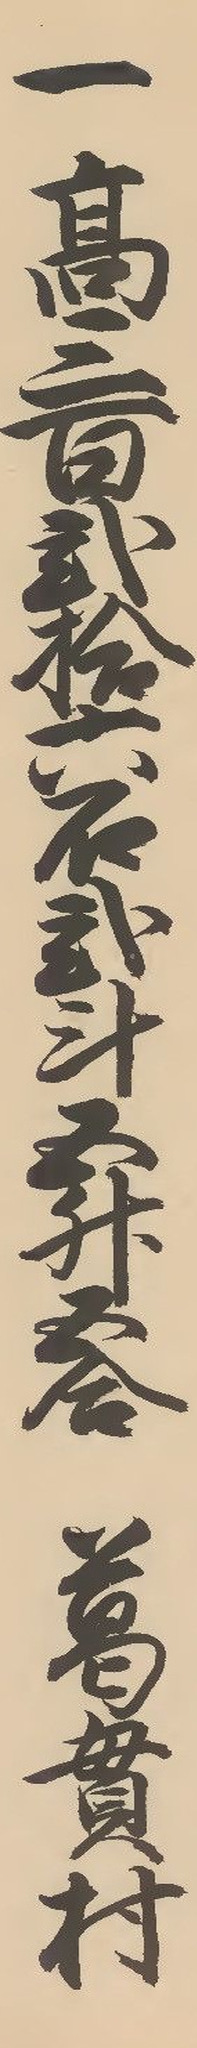一高三百弐拾六石弐斗五升五合葛貫村
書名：武蔵国郷帳　上
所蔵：国立公文書館 National Archives of Japan
